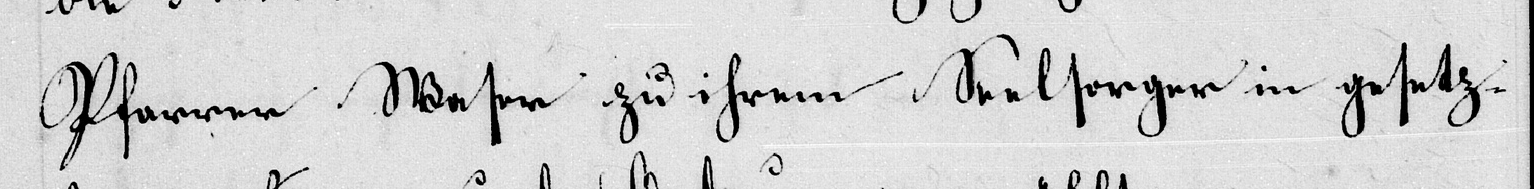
Pfarrer Waser zu ihrem Seelsorger in gesetz¬
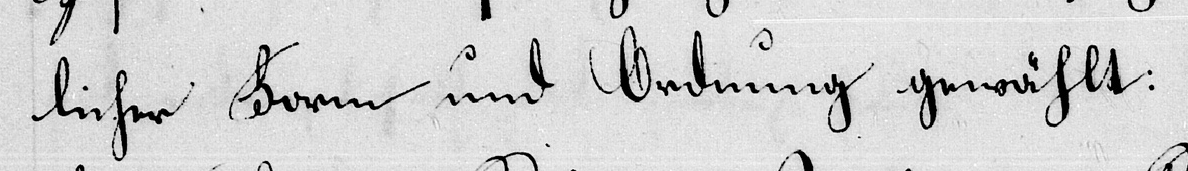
licher Form und Ordnung gewählt:
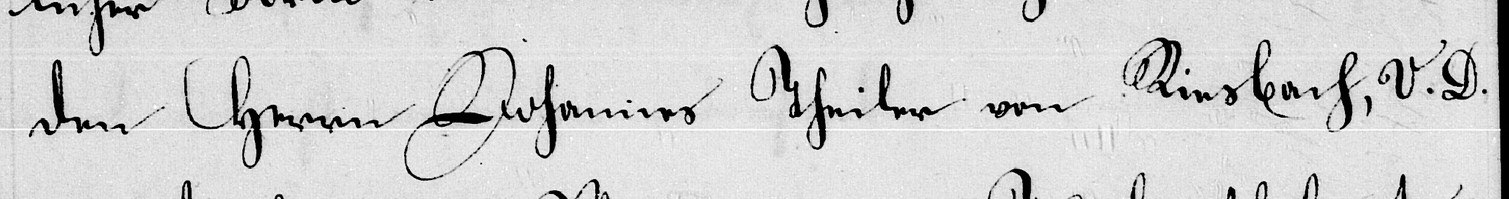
Den Herrn Johannes Theiler von Riesbach, V. D.
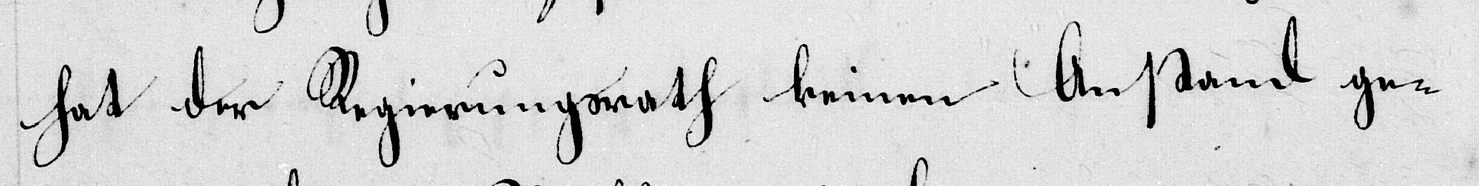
hat der Regierungsrath keinen Anstand ge¬
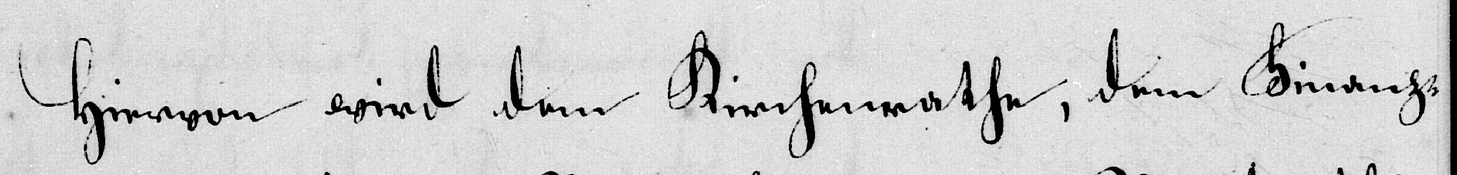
Hiervon wird dem Kirchenrathe, dem Finanz¬
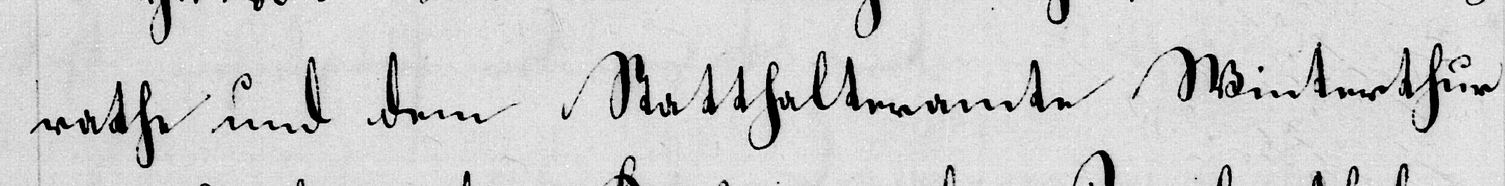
rathe und dem Statthalteramte Winterthur
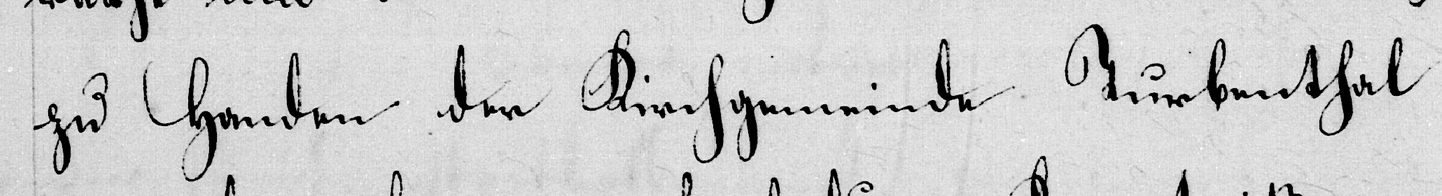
zu Handen der Kirchgemeinde Turbenthal
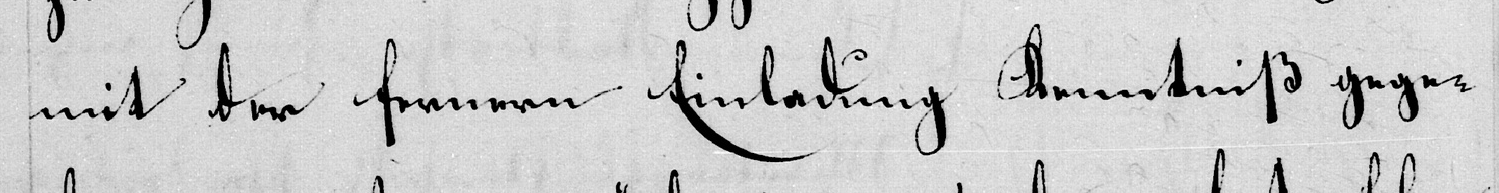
mit der fernern Einladung Kenntniß gege¬
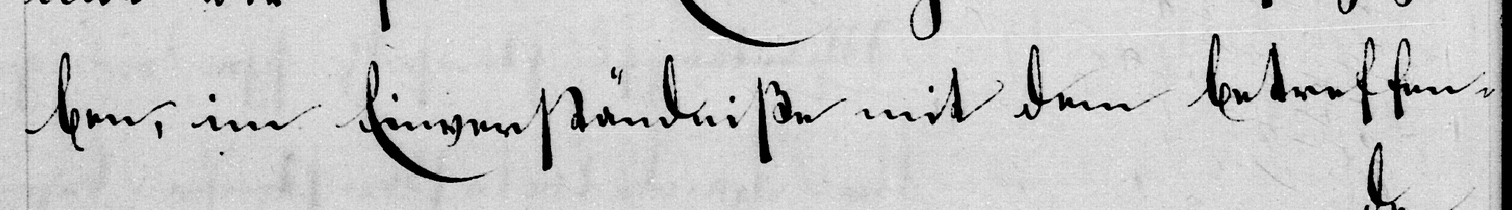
ben, im Einverständniße mit dem betreffen-
